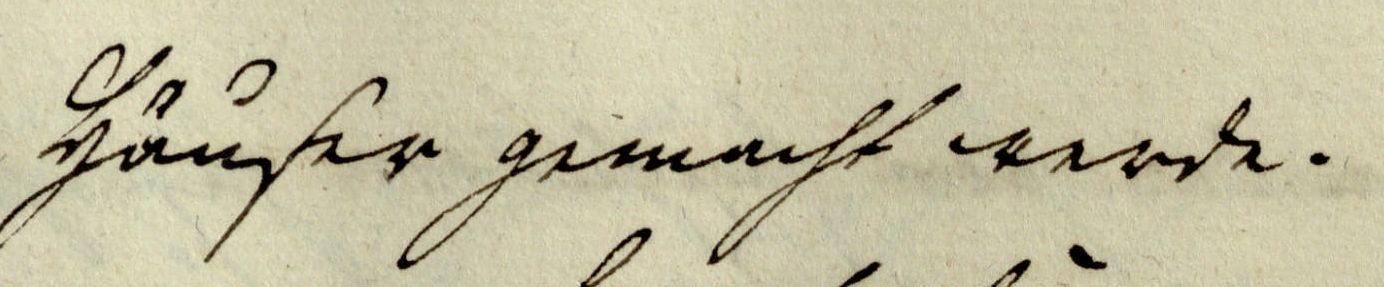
Häuser gemacht werde.
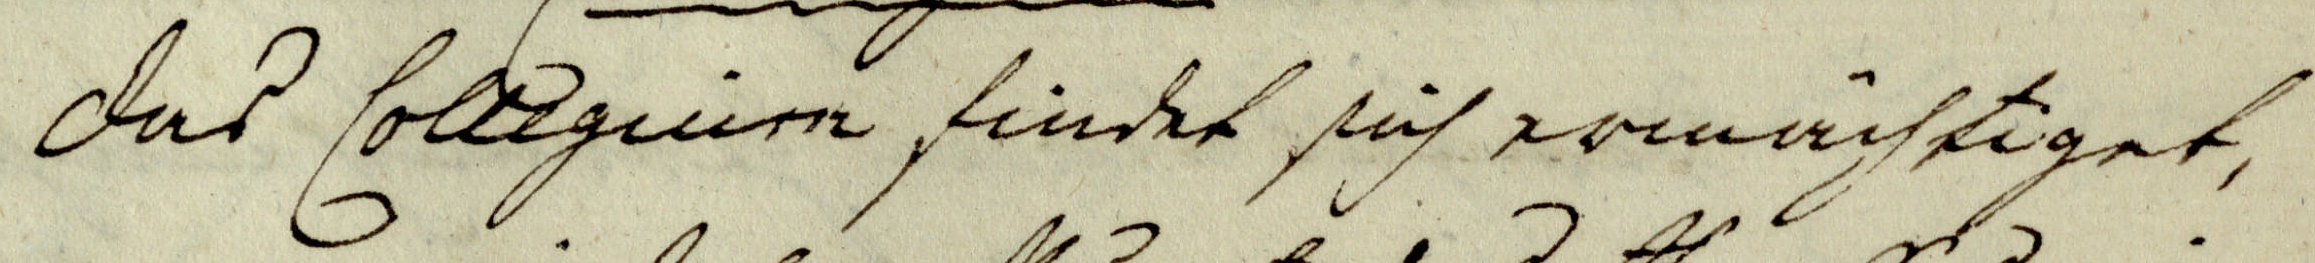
Das Collegium findet sich ermächtiget,
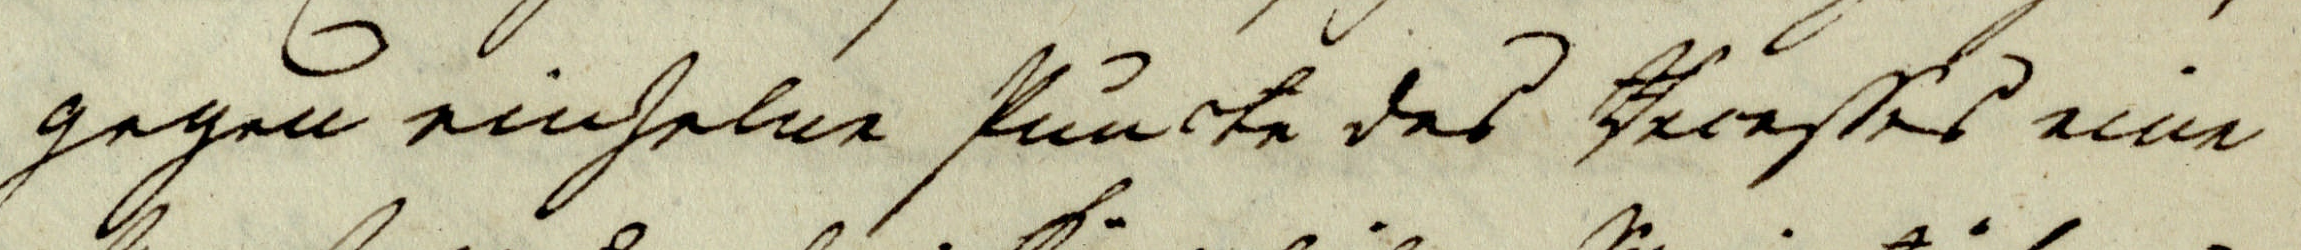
gegen einzelne Puncte des Recesses eine
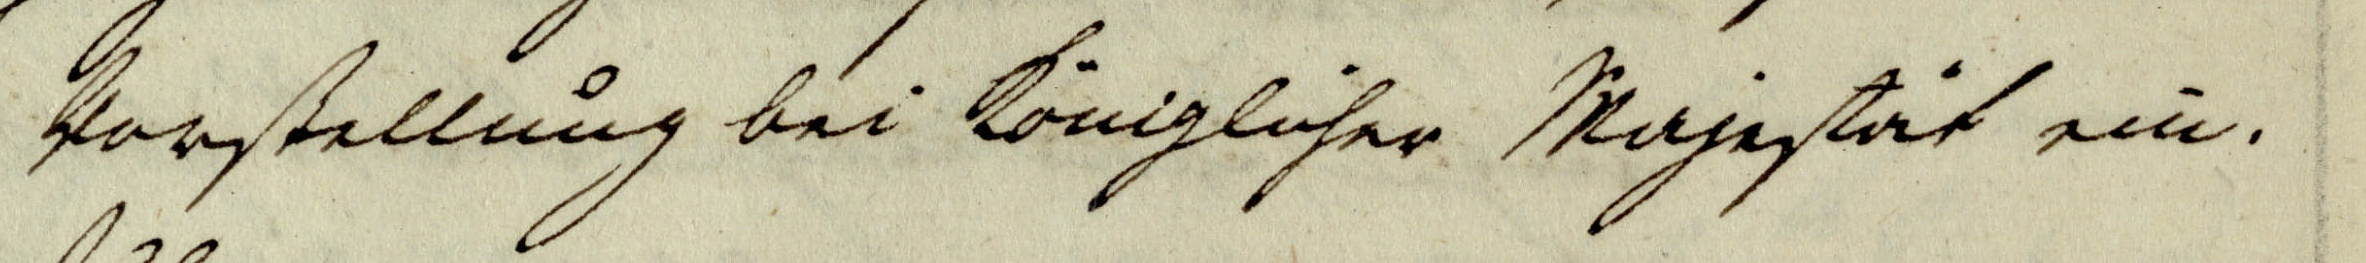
Vorstellung bei Königlicher Majestät ein¬
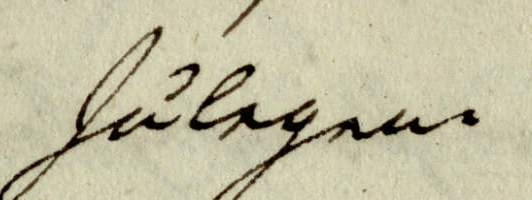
zulegen.
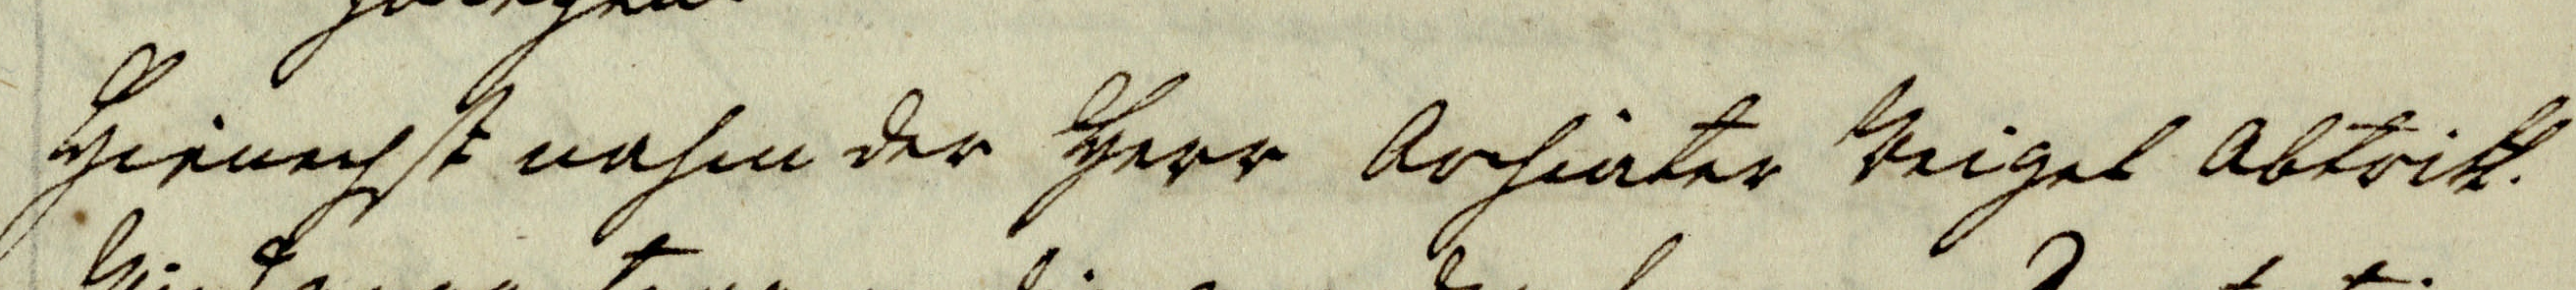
Hienechst nahm der Herr Archiater Weigel Abtritt.
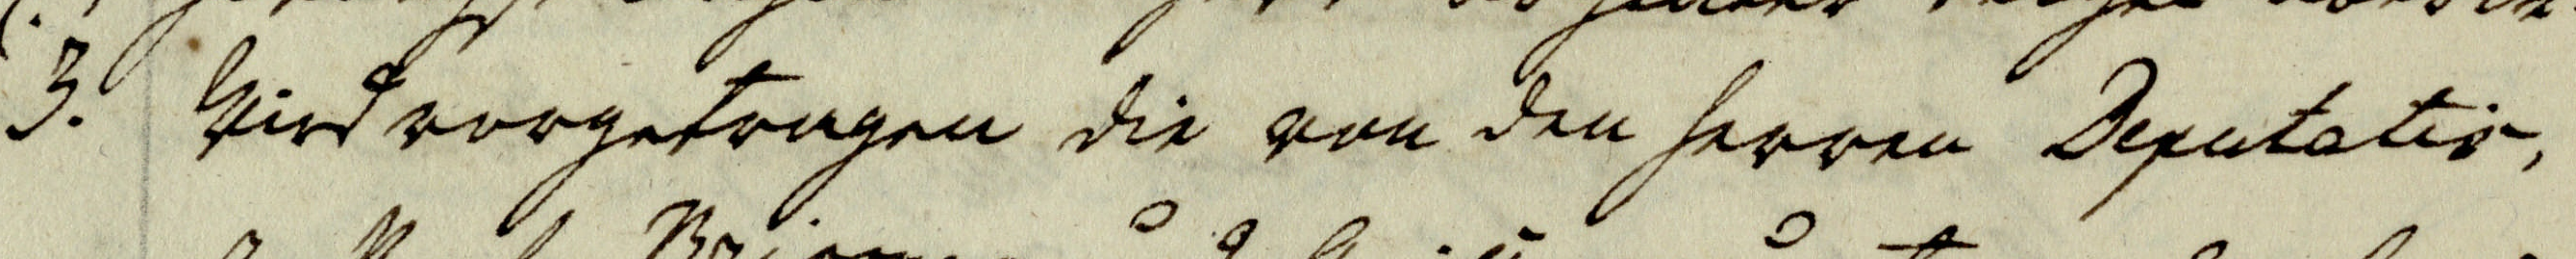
3. Wird vorgetragen die von den Herren Deputatis,
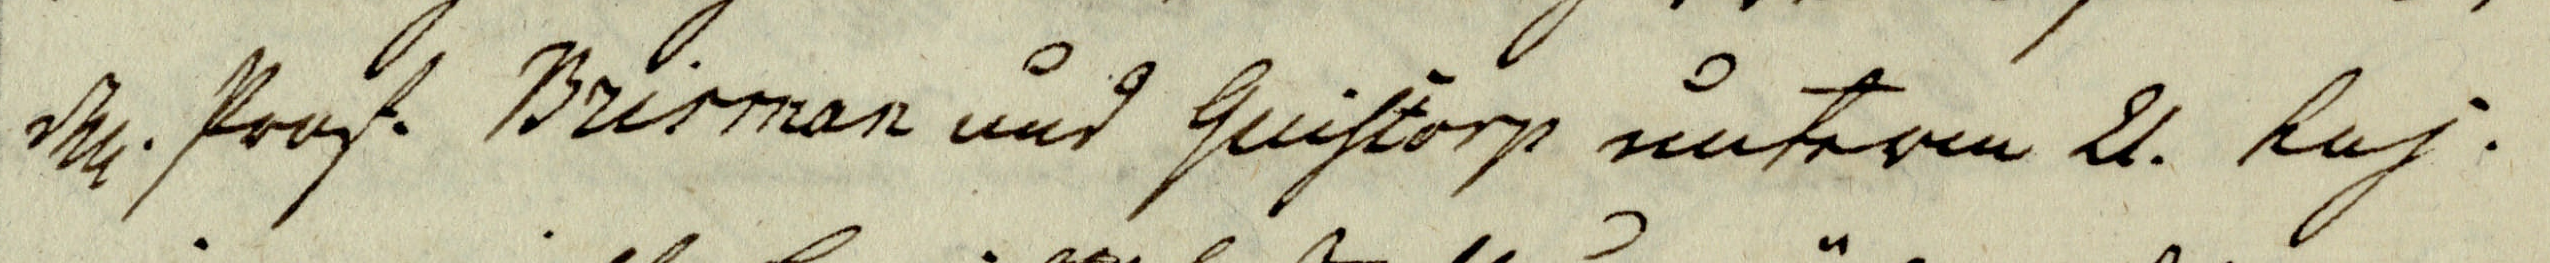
dh. Prof. Brisman und Quistorp unterm 21. huj.
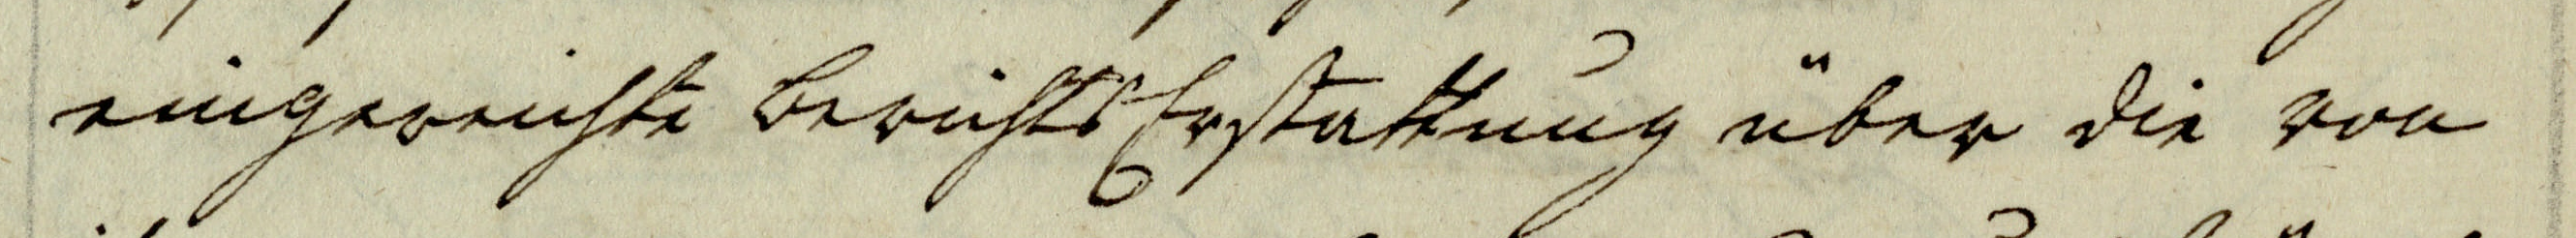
eingereichte BerichtsErstattung über die von
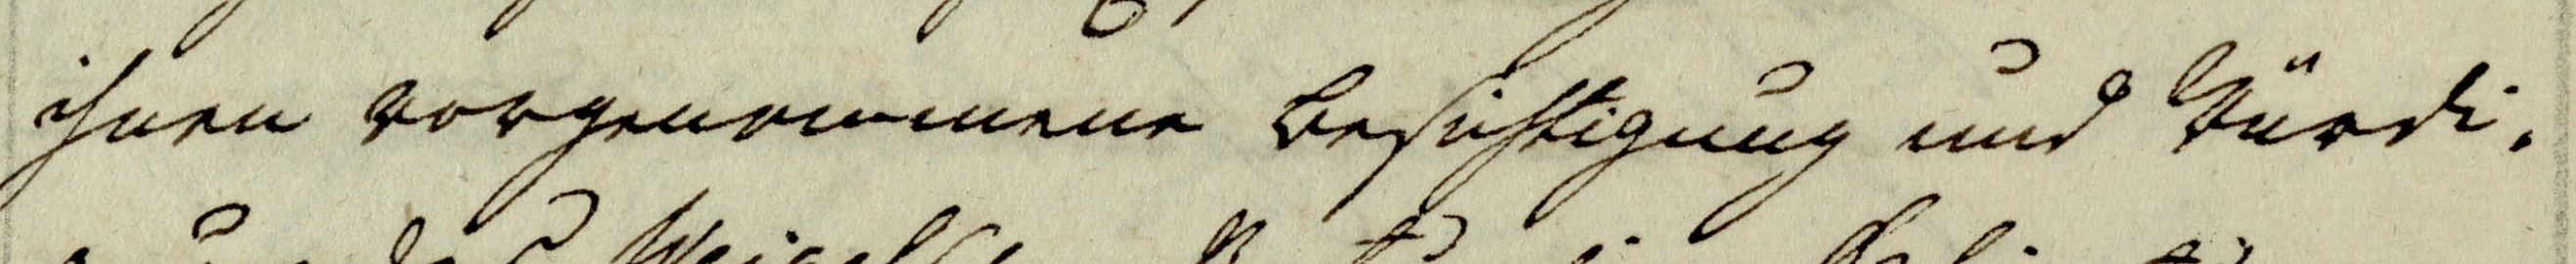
ihnen vorgenommene Besichtigung und Würdi¬
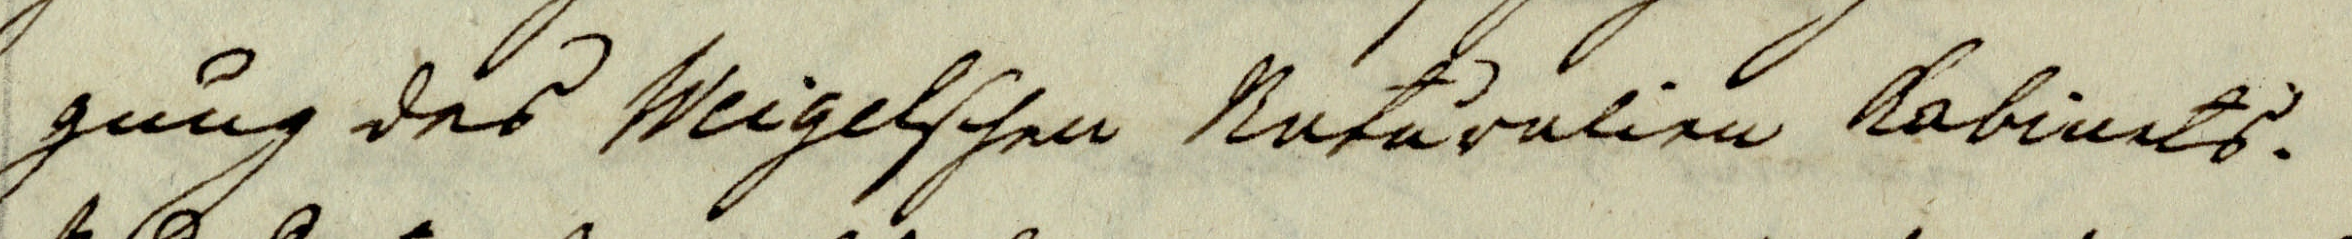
gung des Weigelschen Naturalien Kabinets.
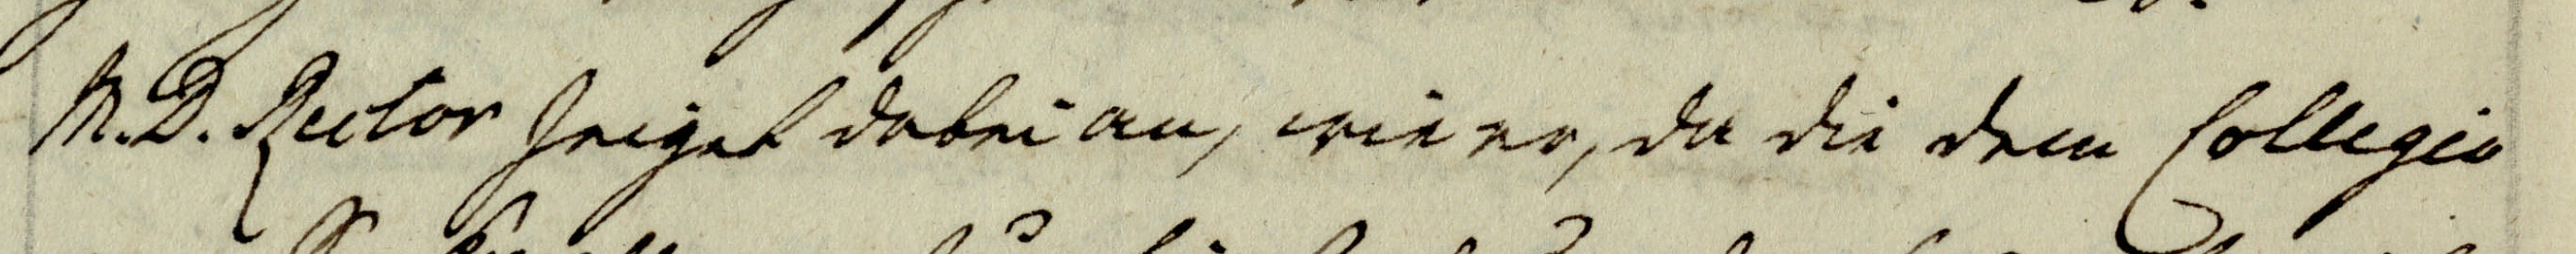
M . Rector zeiget dabei an, wie er, da die dem Collegio
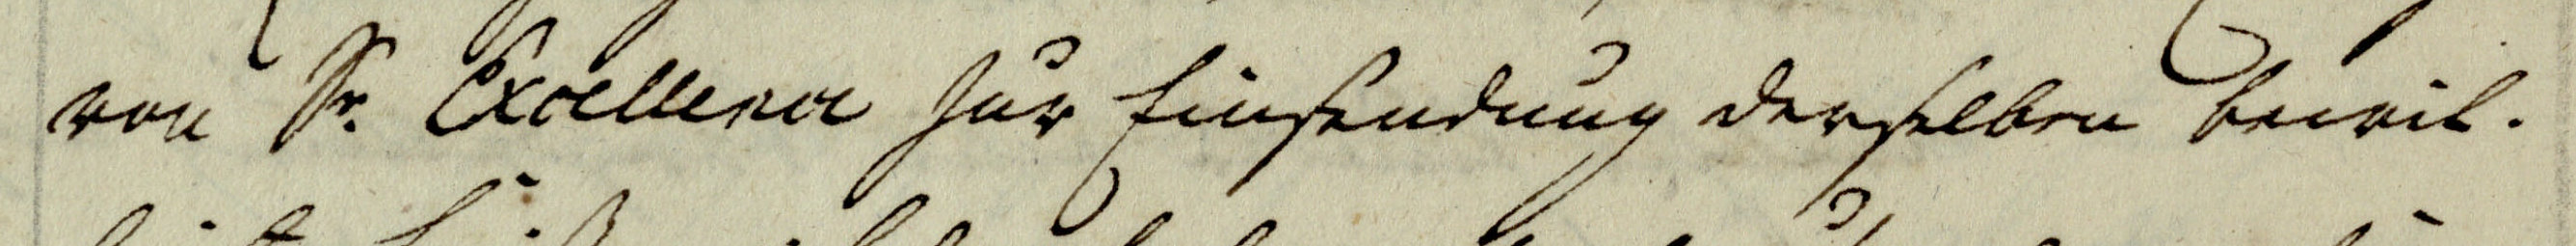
von Sr Excellence zur Einsendung derselben bewil¬
